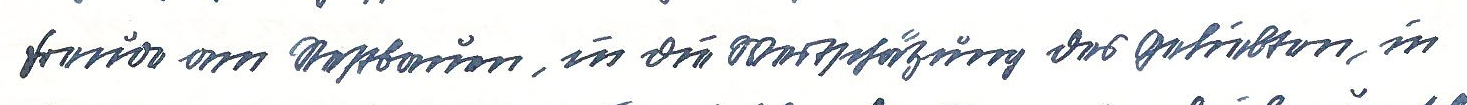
Freude am Nestbauen, in die Wertschätzung des Geliebten, in
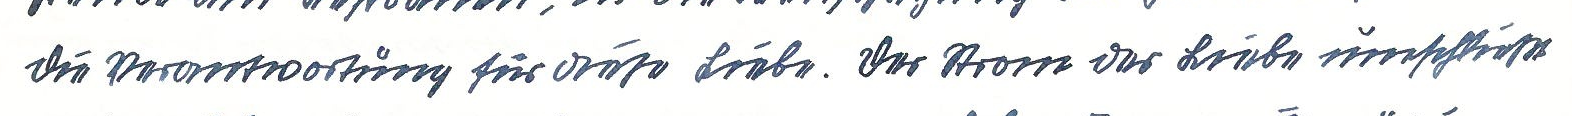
die Verantwortung für diese Liebe. Der Strom der Liebe umschließt
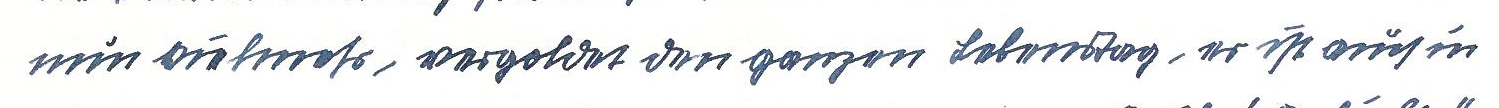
nun vielmehr, vergoldet den ganzen Lebenstag, er ist auch in
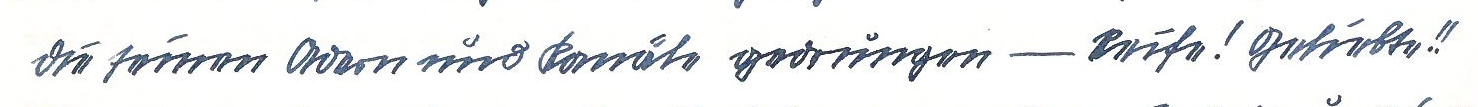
die feinen Adern und Kanäle gedrungen — Reife! Geliebte!!
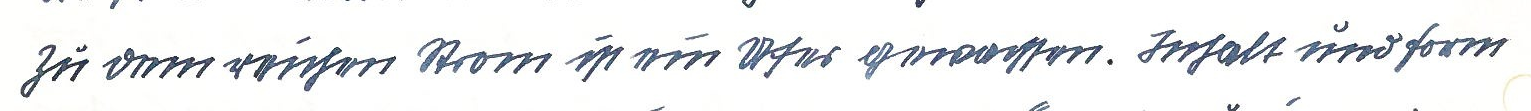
Zu dem reichen Strom ist ein Ufer gewachsen. Inhalt und Form
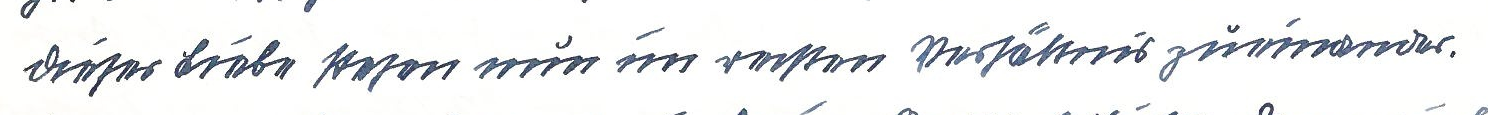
dieser Liebe stehen nun im rechten Verhältnis zueinander.
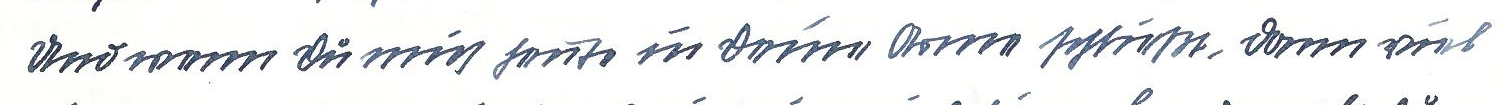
Und wenn Du mich heute in Deine Arme schließt, dann viel
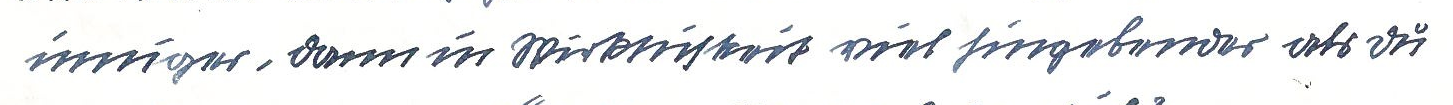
inniger, dann in Wirklichkeit viel hingebender als Du
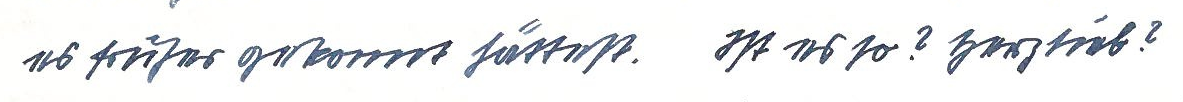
es früher gekonnt hättest. Ist es so? Herzlieb?
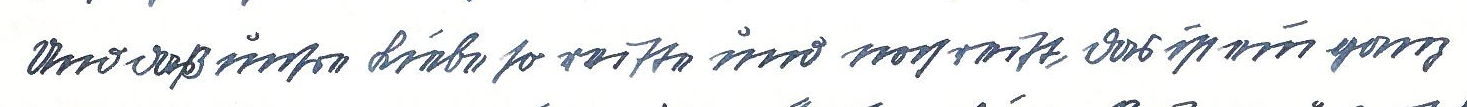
Und daß unsre Liebe so reifte und noch reift, das ist ein ganz
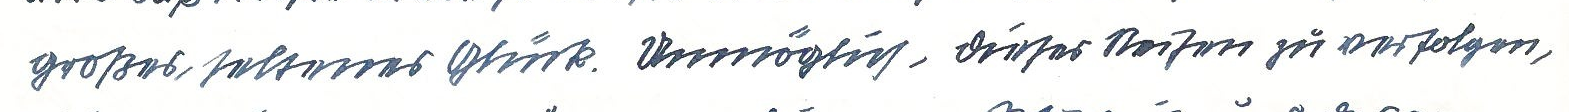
großes, seltenes Glück. Unmöglich, dieses Reifen zu verfolgen,
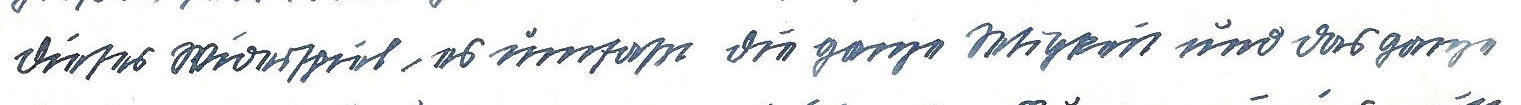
dieses Widerspiel, es umfaßt die ganze Seligkeit und das ganze
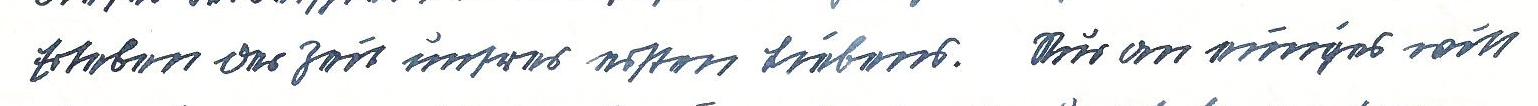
Erleben der Zeit unsres ersten Liebens. Nur an einiges will
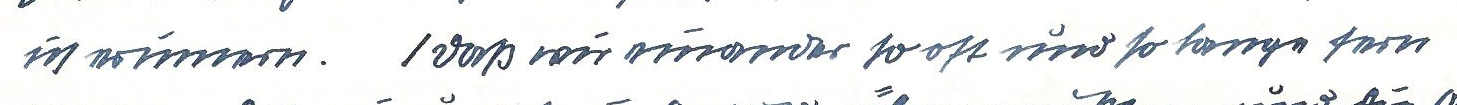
ich erinnern. / Daß wir einander so oft und so lange fern
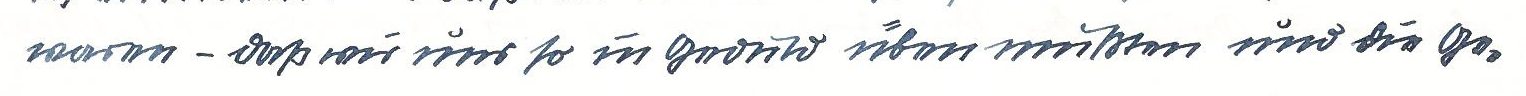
waren – daß wir uns so in Geduld üben mußten und die Ge¬
